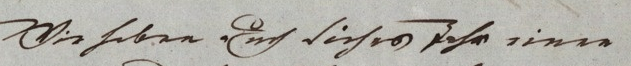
Wir haben auch dieses Jahr einen
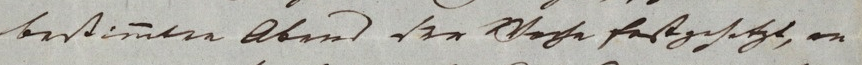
bestimmten Abend der Woche festgesetzt, an
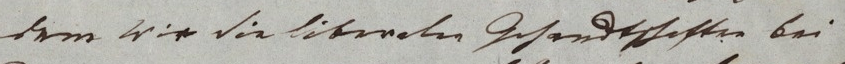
dem wir die liberalen Gesandtschaften bei
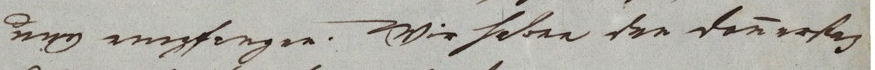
uns empfangen. Wir haben den Donnerstag
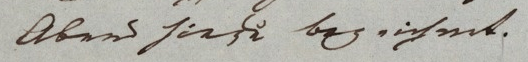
Abend hiezu bezeichnet.
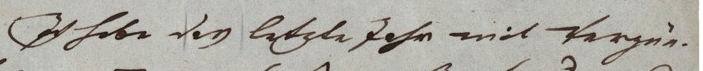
Ich habe das letzte Jahr mit Vergnü-
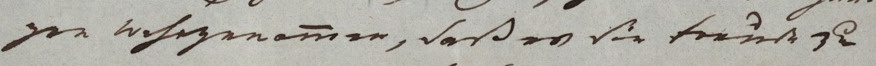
gen wahrgenommen, daß es Dir Freude zu
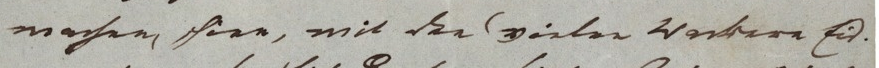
machen schien, mit den vielen wackern Eid-
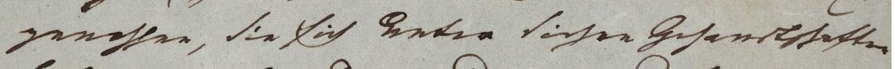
genossen, die sich unter diesen Gesandtschaften
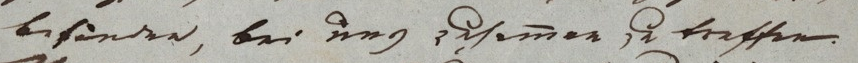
befinden, bei uns zusammen zu treffen.
